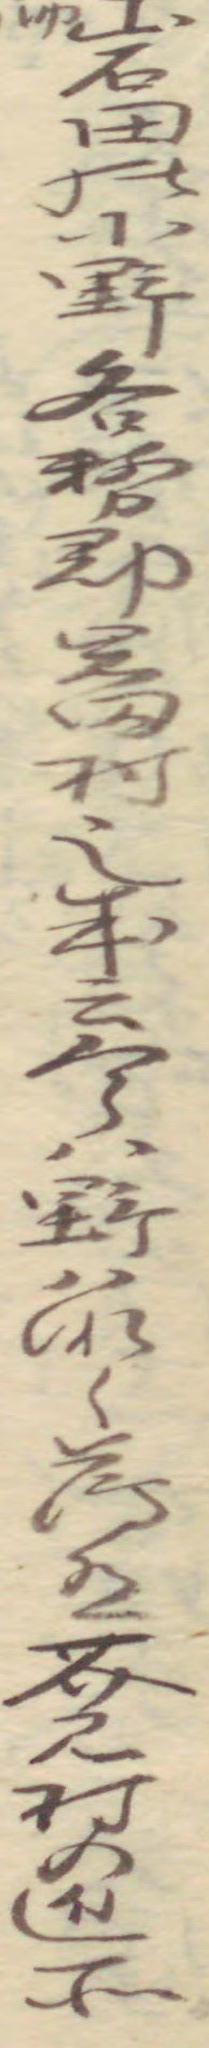山石田の小野各務郡岩田村也或云今は野はなく薄有芥見村の近所
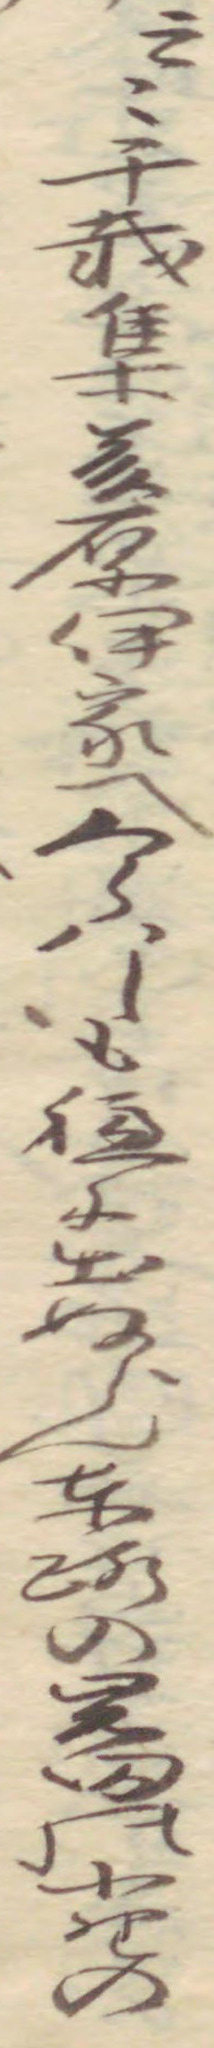云〻千載集藤原伊家〽今はしも穂に出ぬらん東路の岩田の小野の
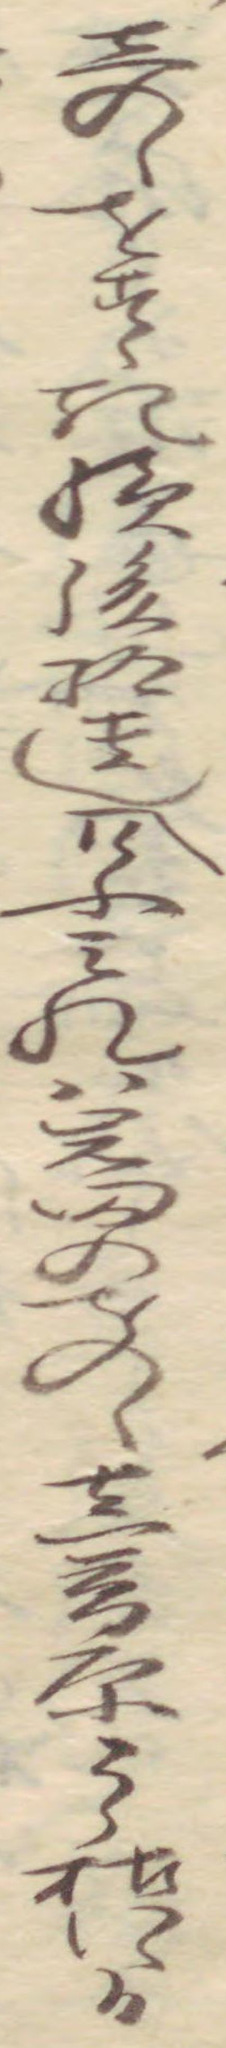しのゝをすゝき続後拾遺〽けふみれは岩田のをのゝ真葛原うら枯わたる
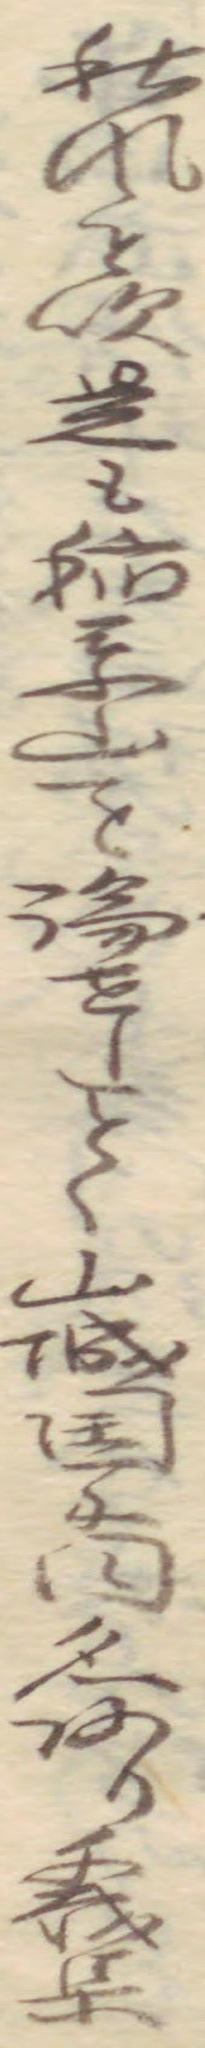秋風そ吹是も稲葉山を論せしことく山城国に同名あり千載集
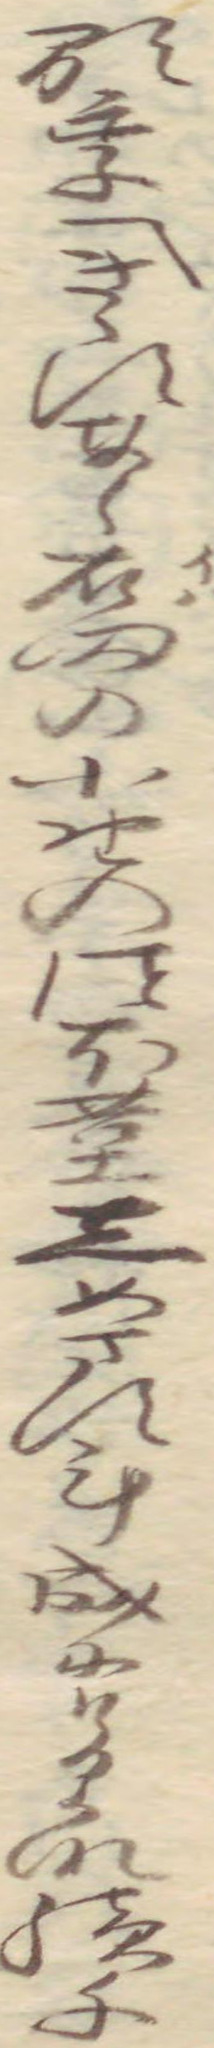顕季〽きゝすなく石田の小野のつほ菫しめさす計成にけるかな続千
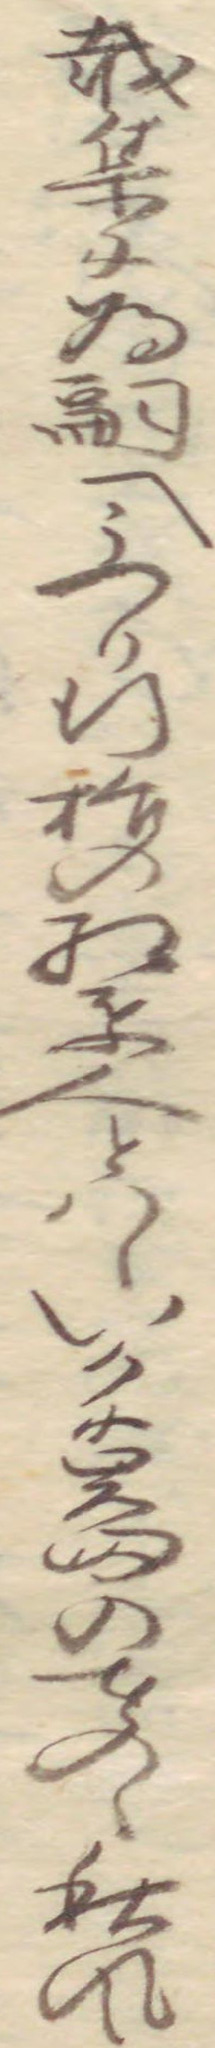載集に為嗣〽うつり行柞の紅葉人とはゝいかに岩田のをのゝ秋風
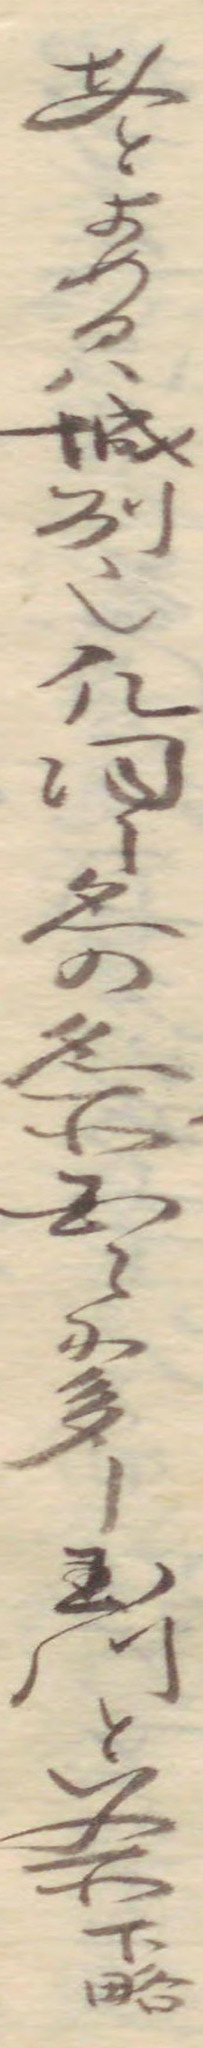なとよめるは城州なり凡同し名の名所国〻に多し玉川といふ所下略
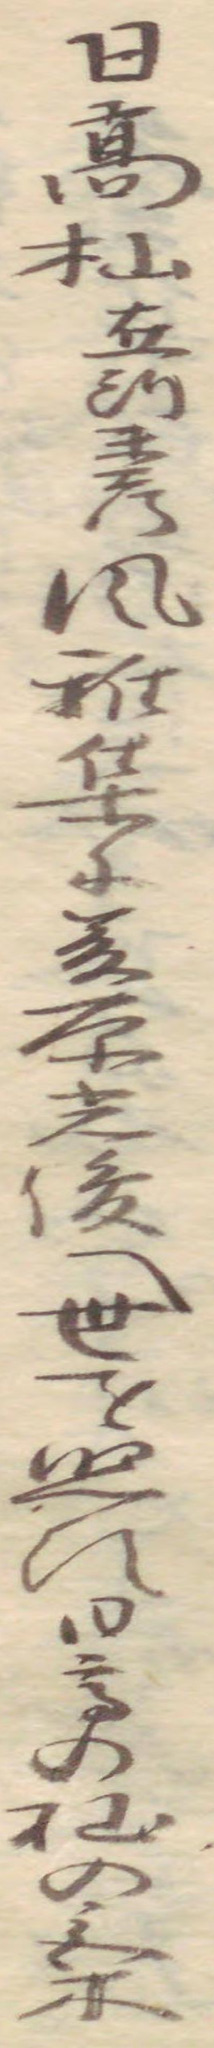日高杣在所未考風雅集に藤原光俊〽世を照す日高の杣の宮木
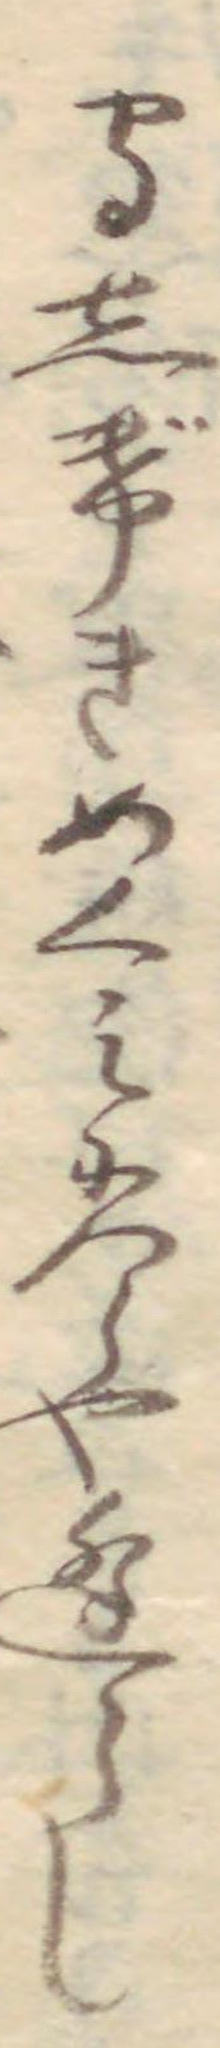守しげきめくみに今や逢らし
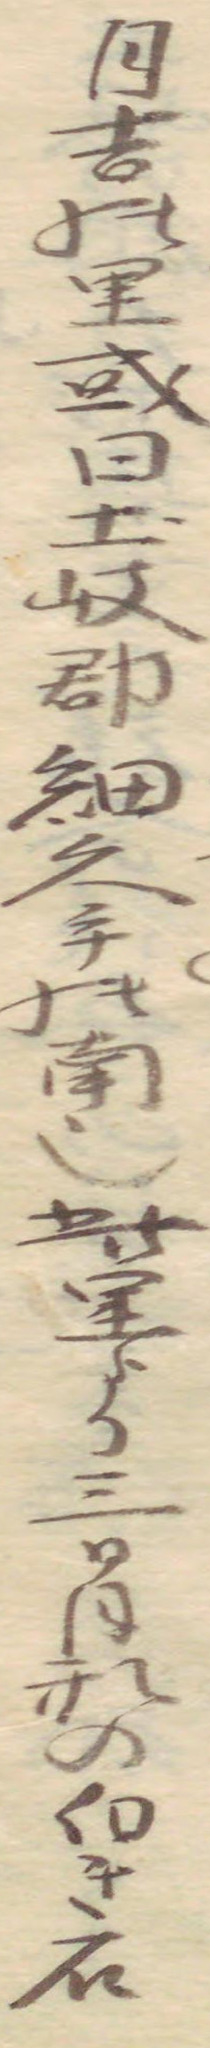月吉の里或曰土岐郡細久手の南也此里より三日月形の白き石
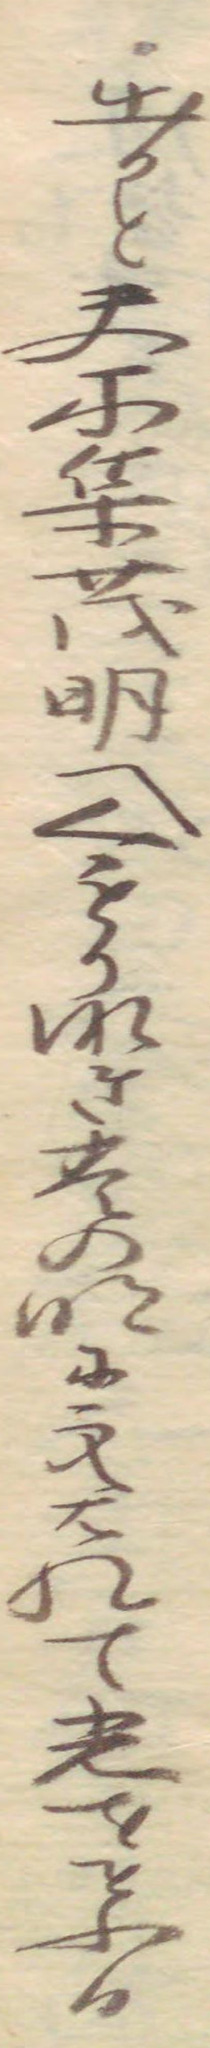出ると夫木集茂明〽くもりなき豊の明に空はれてひかりをそふる

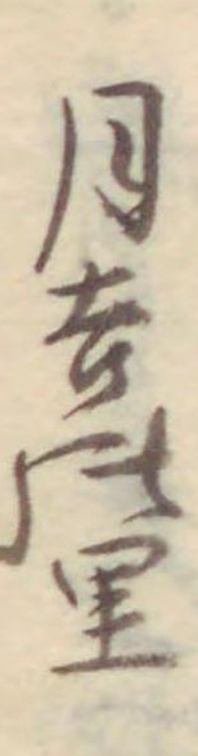月吉の里
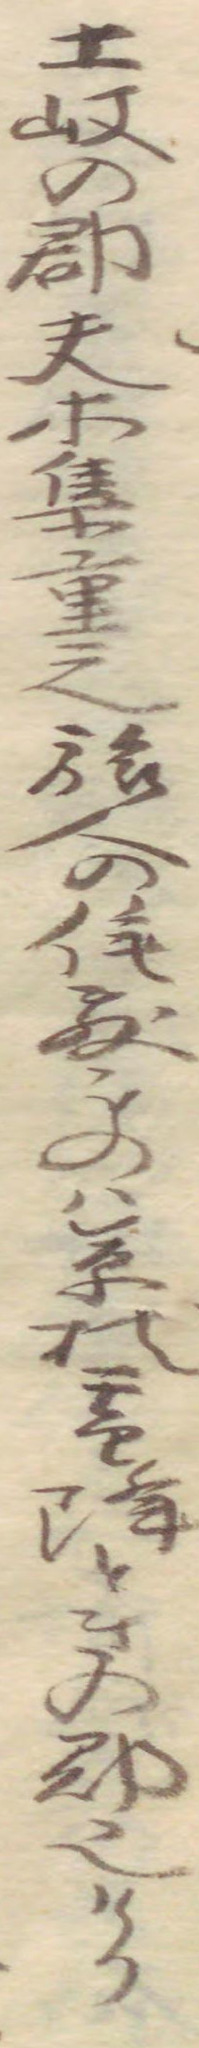土岐の郡夫木集重之旅人の侘敷ものは草枕雪降ときの郡成けり
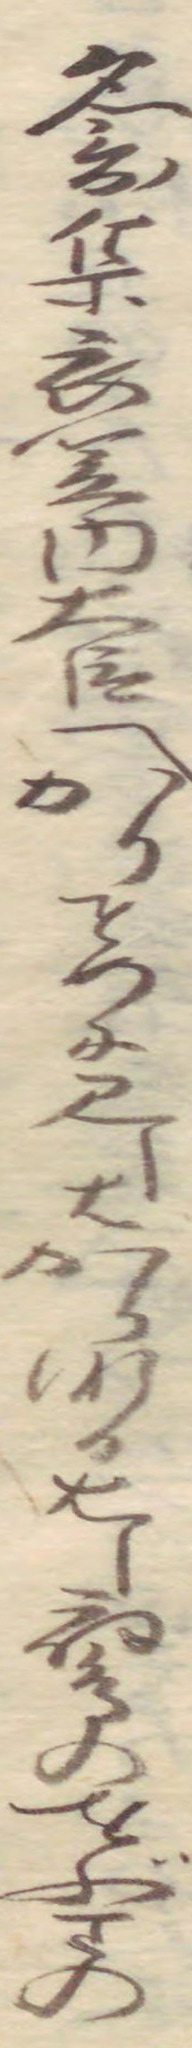名歌集衣笠内大臣〽かりそめに見しはかりなるはし鷹のをぶさの
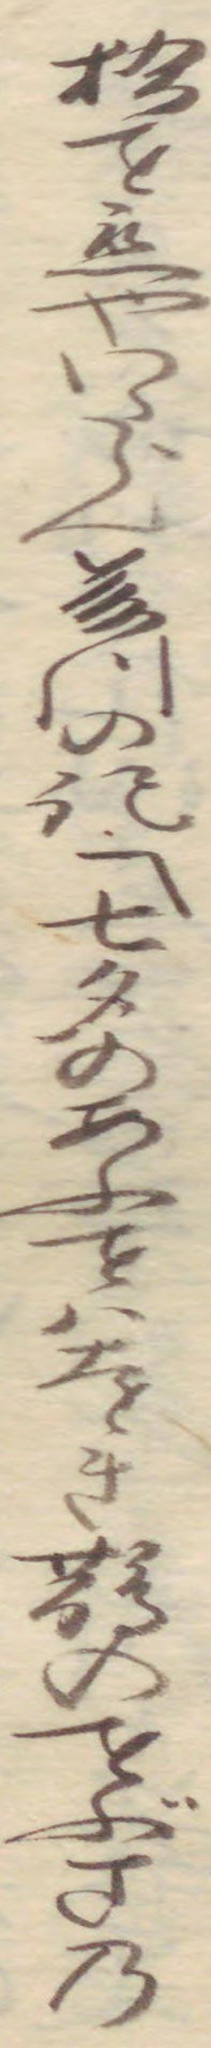橋を恋やわたらん藤川の記〽七夕のあふせは遠き鵲のをぶさの
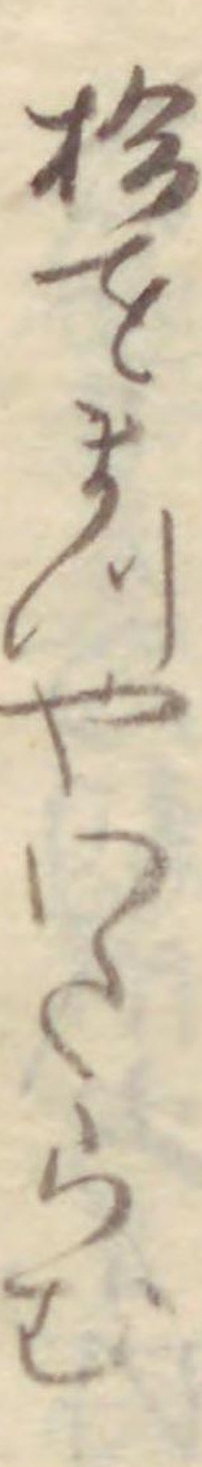橋をまつやわたらむ
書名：鶯宿雑記. 巻263-264
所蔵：国立国会図書館 National Diet Library, JAPAN
